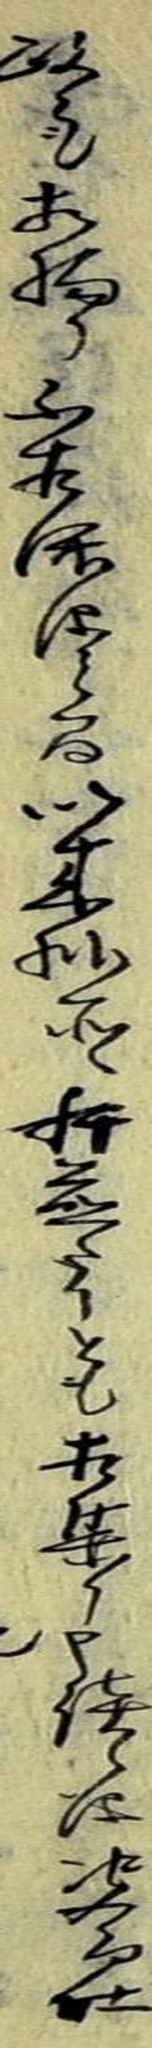政にも相拘り不相済儀に候間以来掛所へ村益たりとも相集り申談候儀決而仕
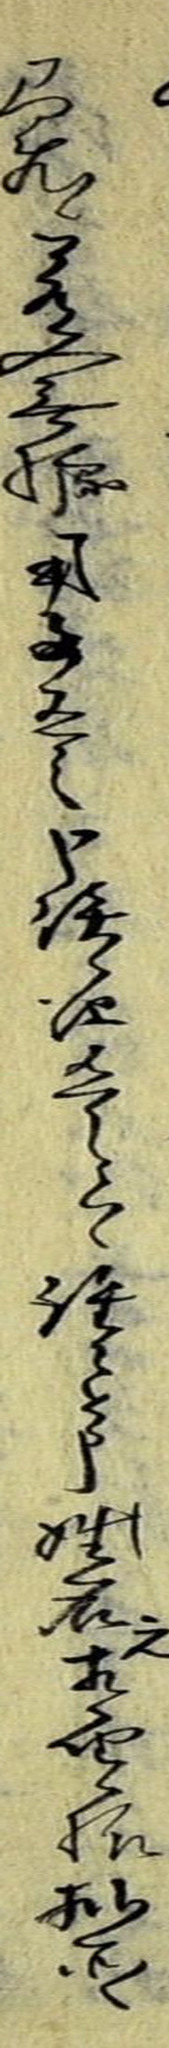間敷候若又無拠用事有之申談候儀有之候はヽ誰々と申姓名元相届候様掛所へ
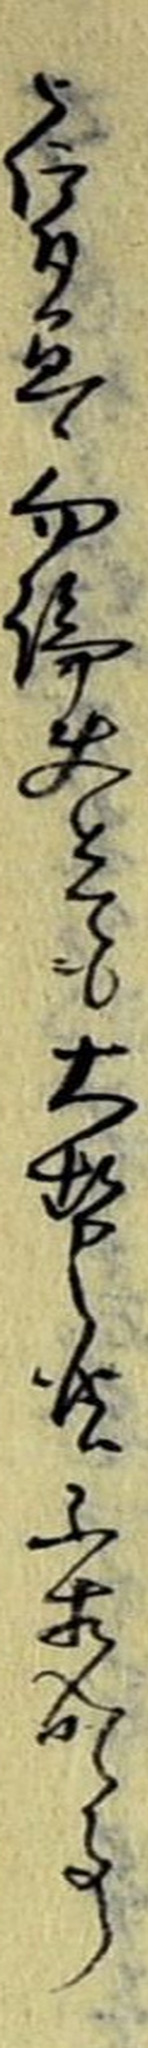被仰付置候勿論夫とても大勢之儀は不相成候事

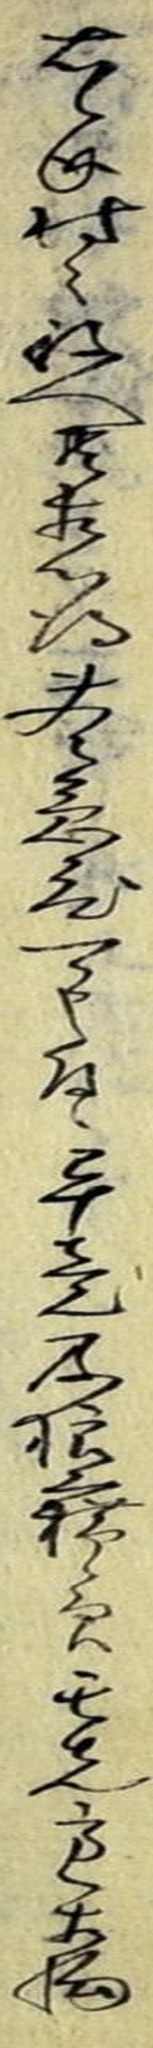右之趣村々役人共相心得夫々急度可申付候畢竟及狼藉候而は其元方へ相拘
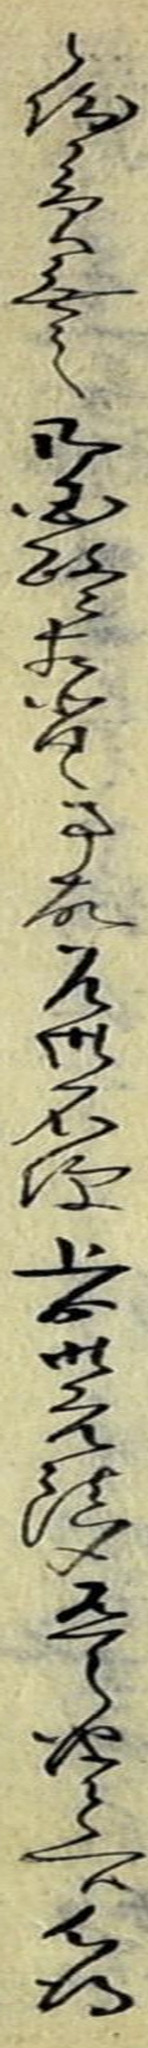之儀に而は無之御国政に相背候事故乍御不深上ゟ御取鎮メ有之儀に候へは心得
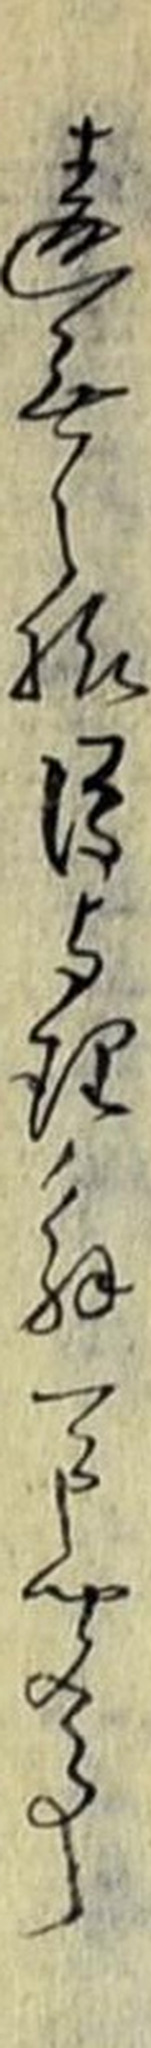違無之様得と理解可申聞事
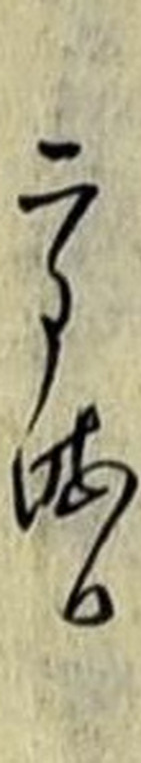二月晦日
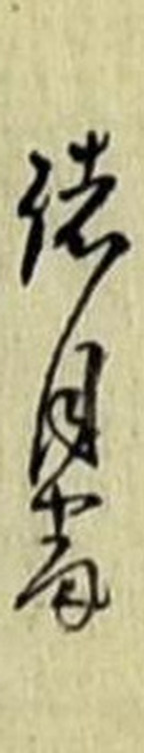諸月番
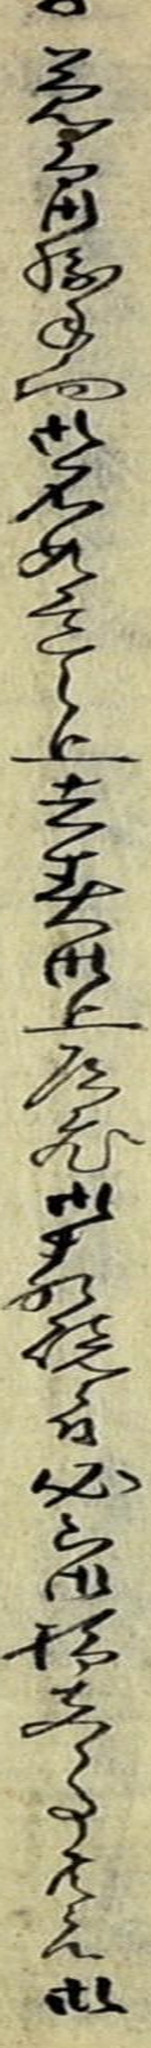○兼而御勝手向御不如意之上去春御上屋敷御類焼に付必至御指支候事共に候御
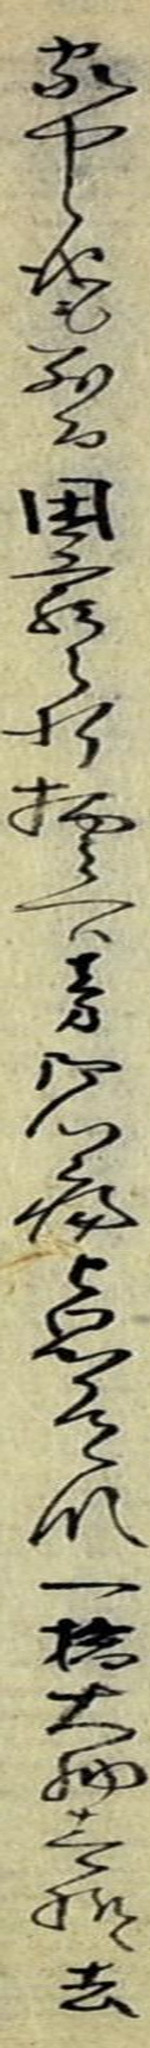家中之儀も別而困窮之折柄に候へは旁御心痛被思召候段一橋大納言様へ去
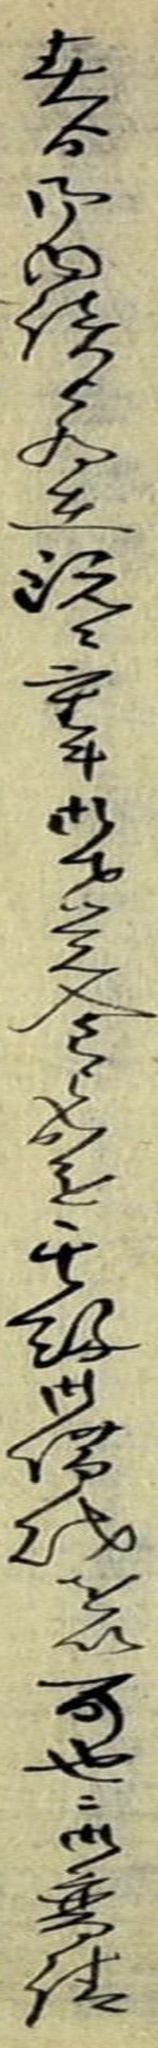春ゟ御内談被為在既に重キ御才覚金被成進其餘御借財を以可也に御普請
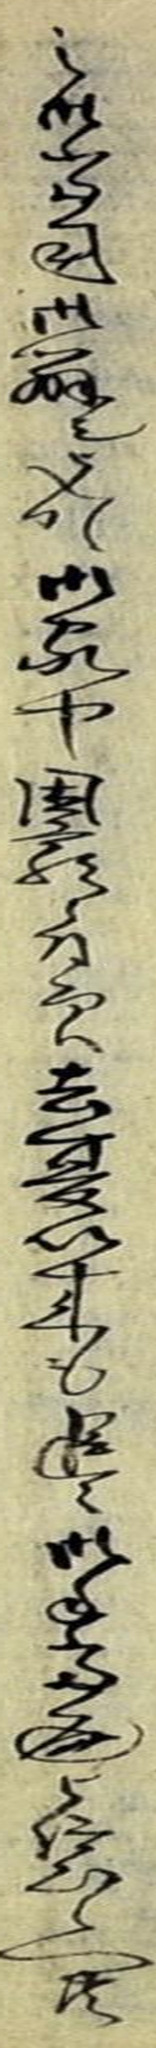之御当用御弁し被成候御家中困窮に付而は去夏以来も追々御手当通被仰出候へ共
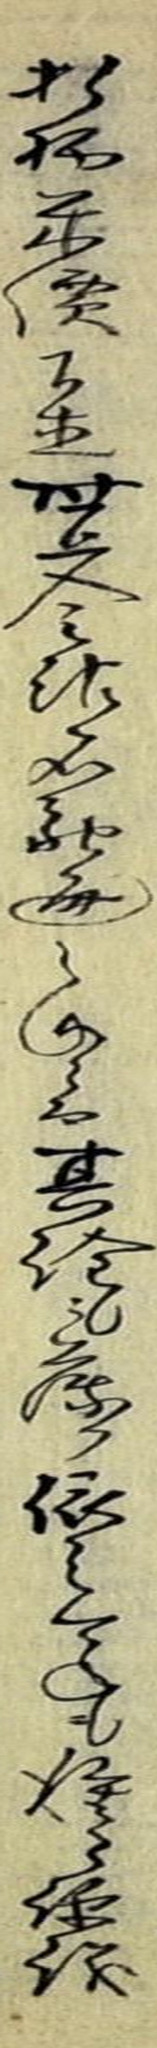折柄米価下直世上金銀不融通之趣に而其詮も薄く依之今年も種々評議
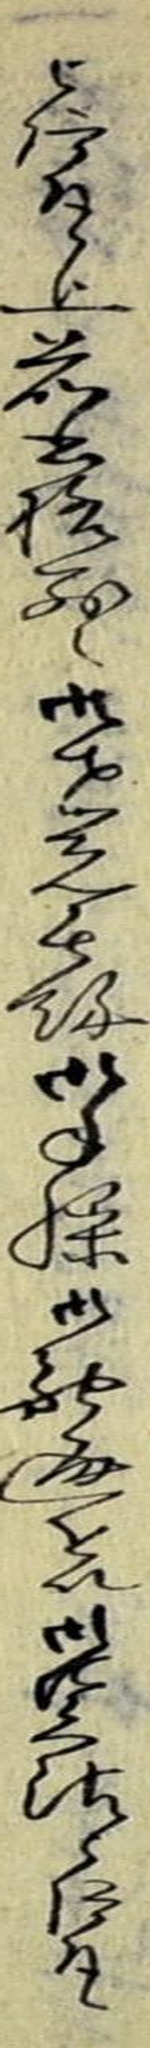被仰付候上前書格別之御才覚其餘御手探御融通を以御貸銀被仰付候
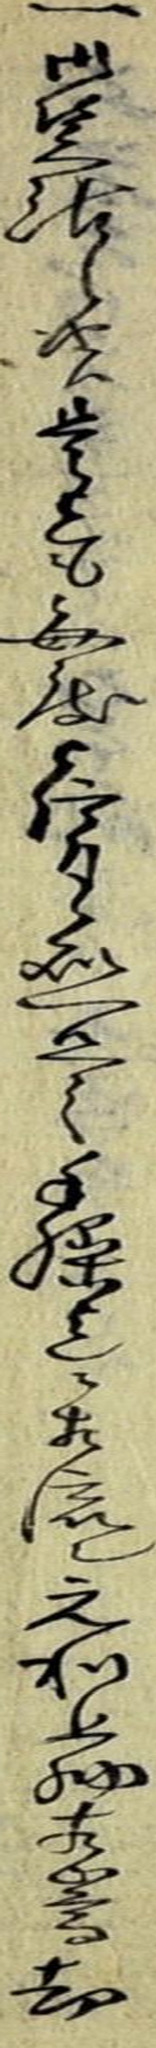一御貸銀之儀は是迄も毎度被仰付候処一旦之手探迄に相流し元利上納相嵩却
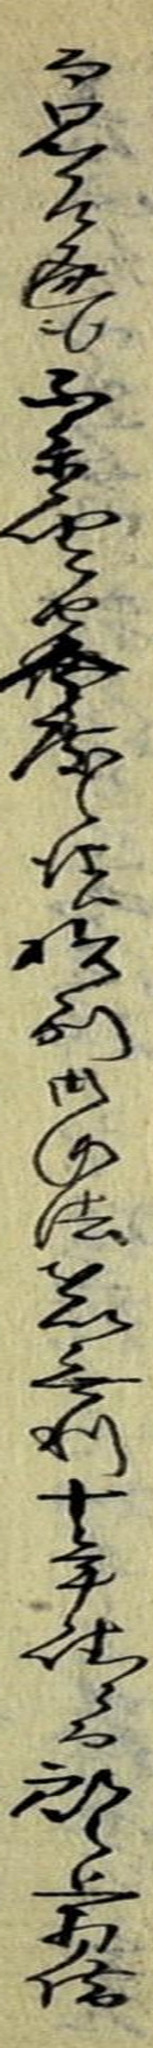而思召通も不示届候由今度之儀は各別御趣法を以無利十年賦に而願之上拝借
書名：命令之部 四
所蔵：福井県文書館 Fukui Prefectural Archives
